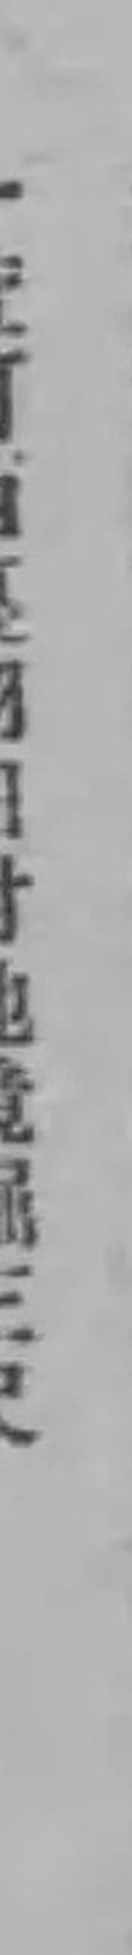一萱町西裏羽田村地境堀三尺
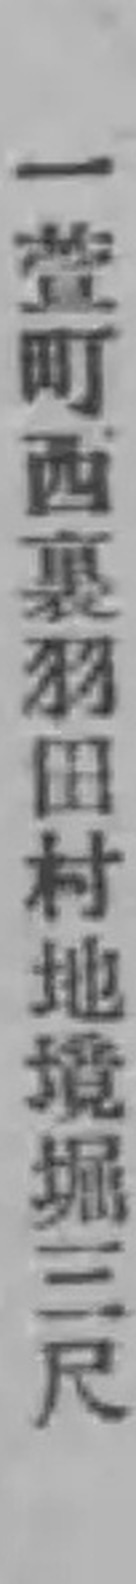一萱町西裏羽田村地境堀三尺
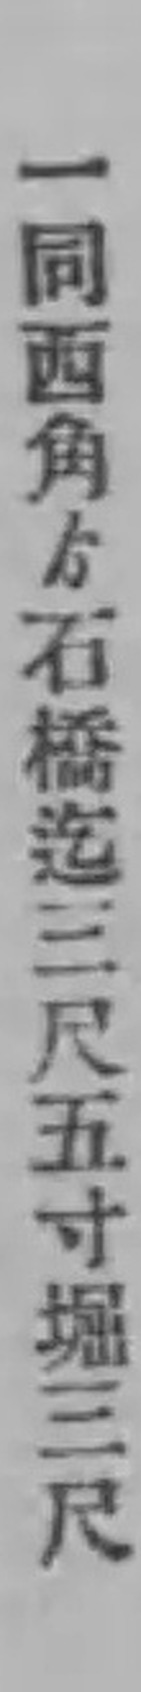一同西角ゟ石橋迄三尺五寸堀三尺
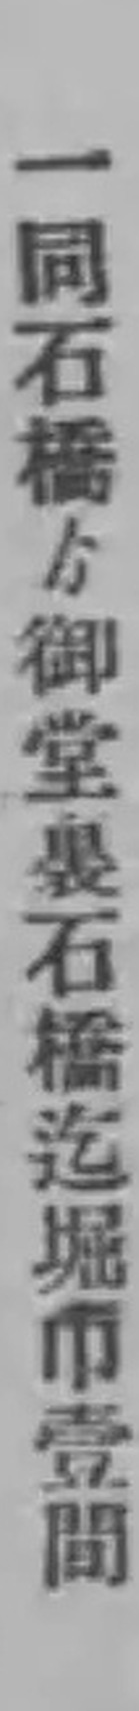一同石橋ゟ御堂裏石橋迄堀巾壱間
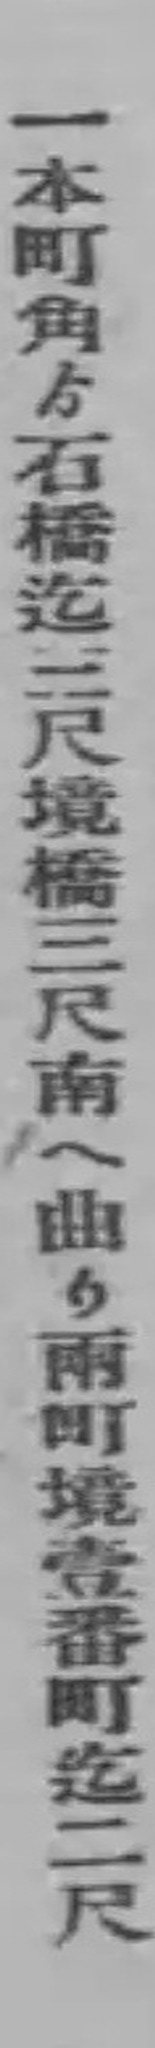一本町角ゟ石橋迄三尺境橋三尺南へ曲り両町境壱番町迄二尺
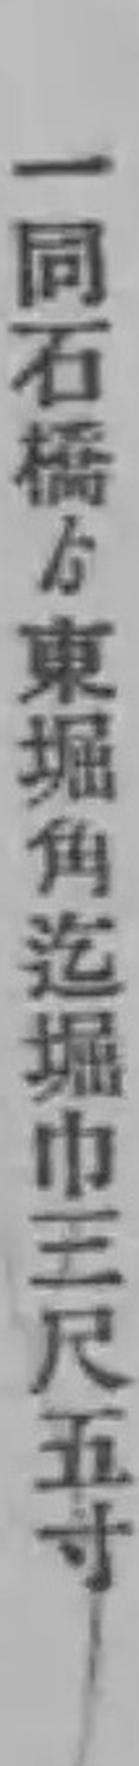一同石橋ゟ東堀角迄堀巾三尺五寸
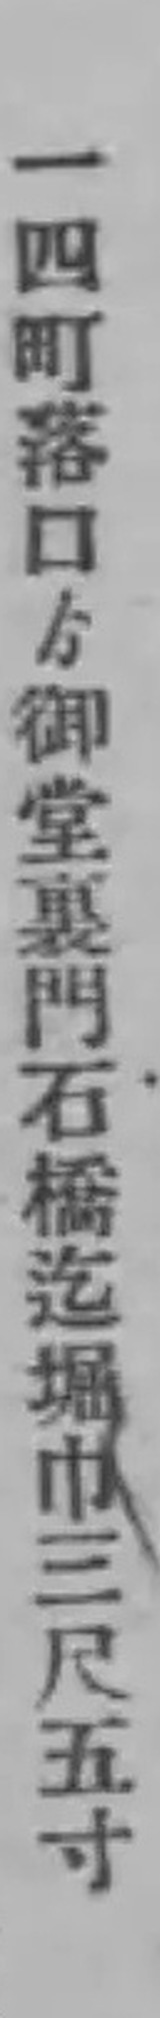一四町落口ゟ御堂裏門石橋迄堀巾三尺五寸
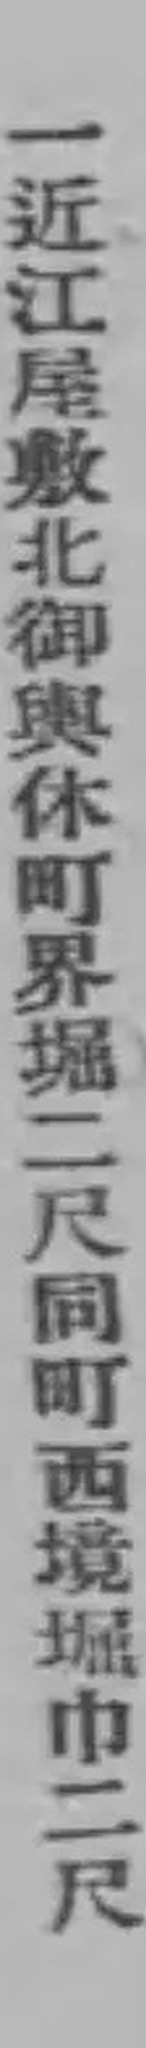一近江屋敷北神輿休町界堀二尺同町西境堀巾二尺
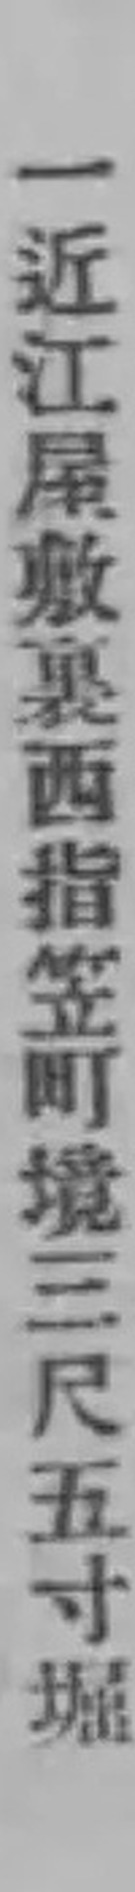一近江屋敷裏西指笠町境三尺五寸堀
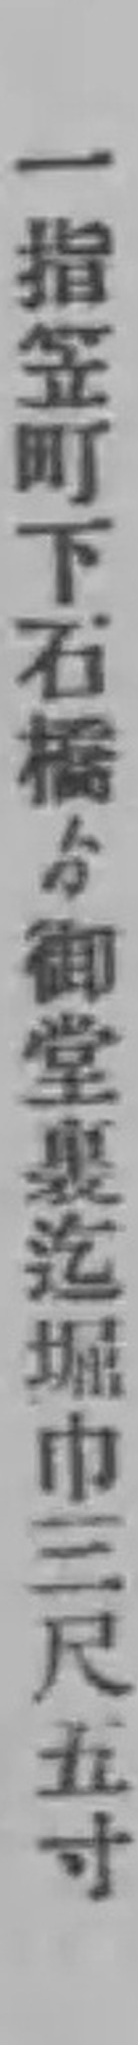一指笠町下石橋ゟ御堂裏迄堀巾三尺五寸
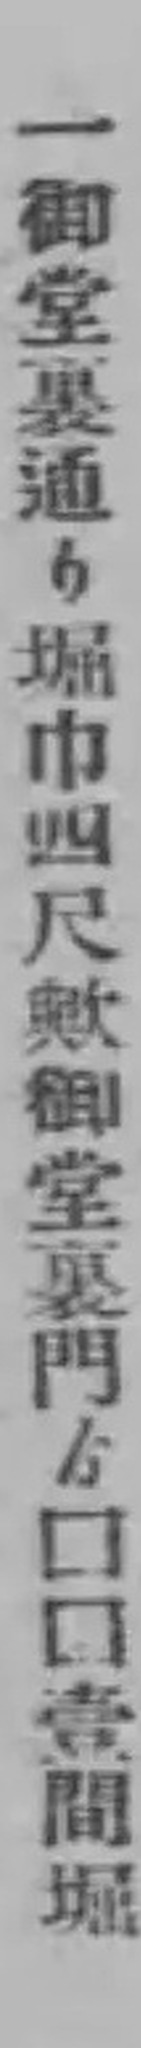一御堂裏通り堀巾四尺歟御堂裏門ゟ口口壱間堀
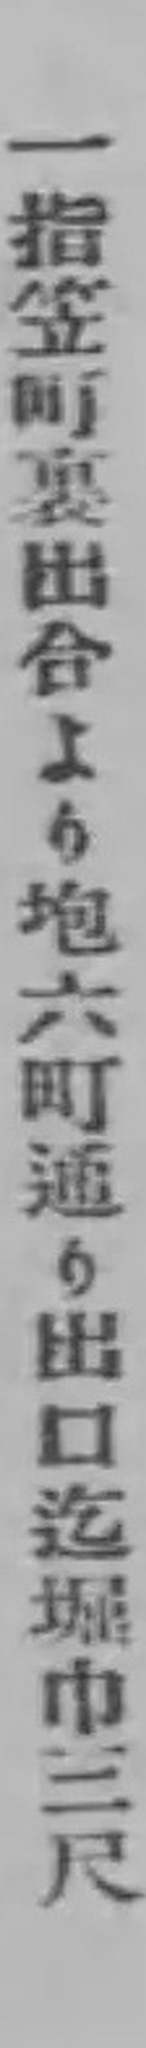一指笠町裏出合より垉六町通り出口迄堀巾三尺
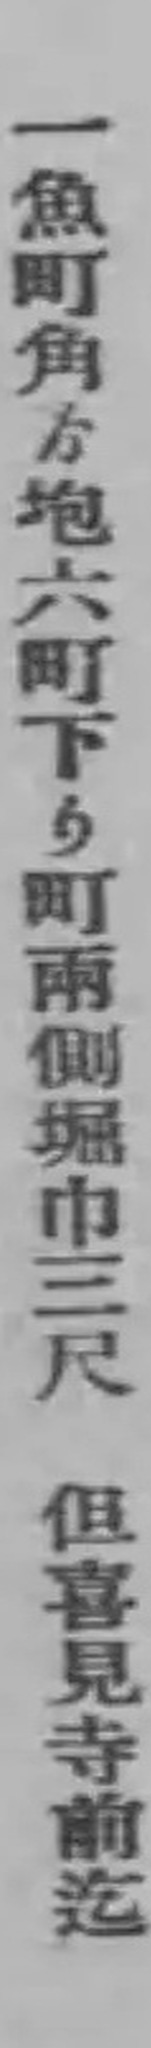一魚町角ゟ垉六町下り町両側堀巾三尺但喜美寺前迄
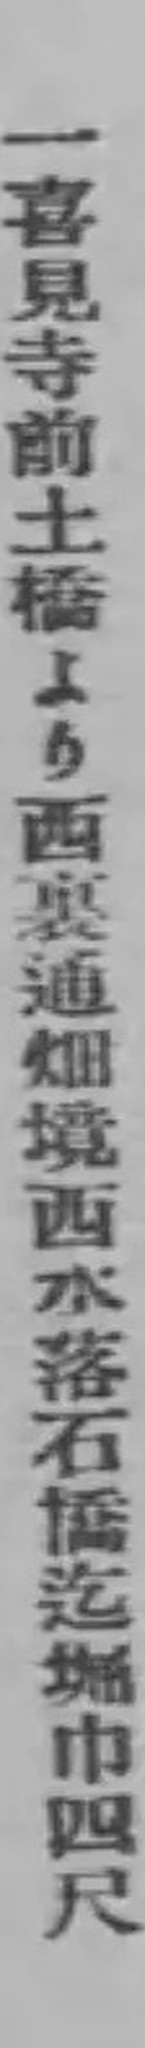一喜美寺前土橋より西裏通畑境西水落石橋迄堀巾四尺
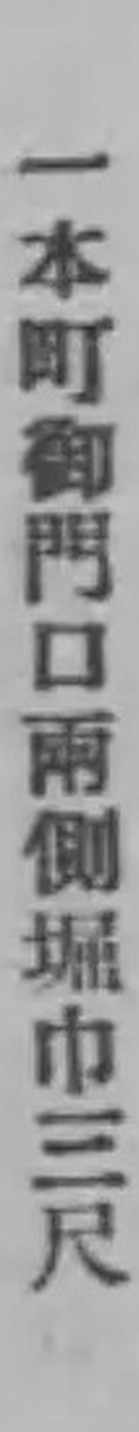一本町御門口両側堀巾三尺
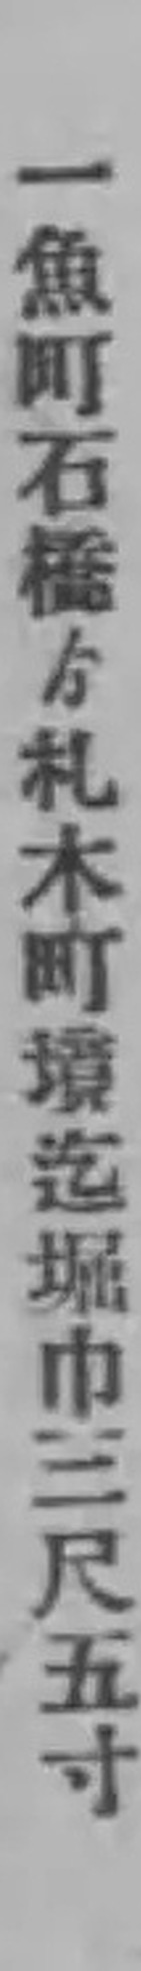一魚町石橋ゟ札木町境迄堀巾三尺五寸
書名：豊橋市史談
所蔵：国立国会図書館 National Diet Library, JAPAN
